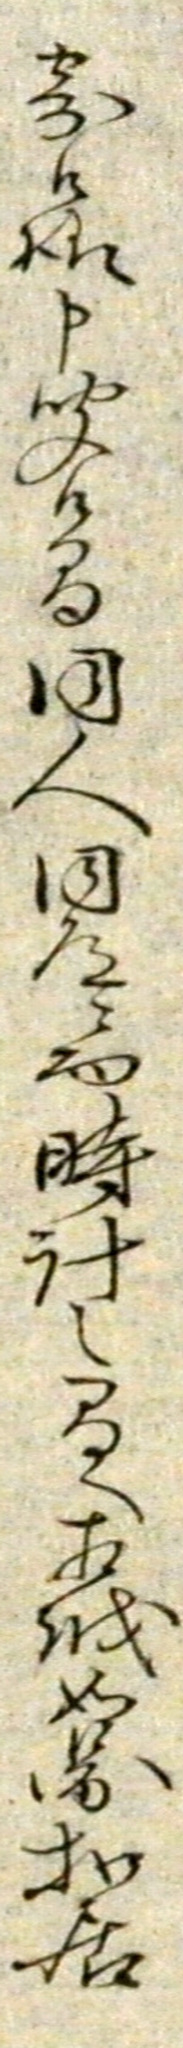寄候様申聞候間同人同道ニ而時計之間へ相越如図扣居
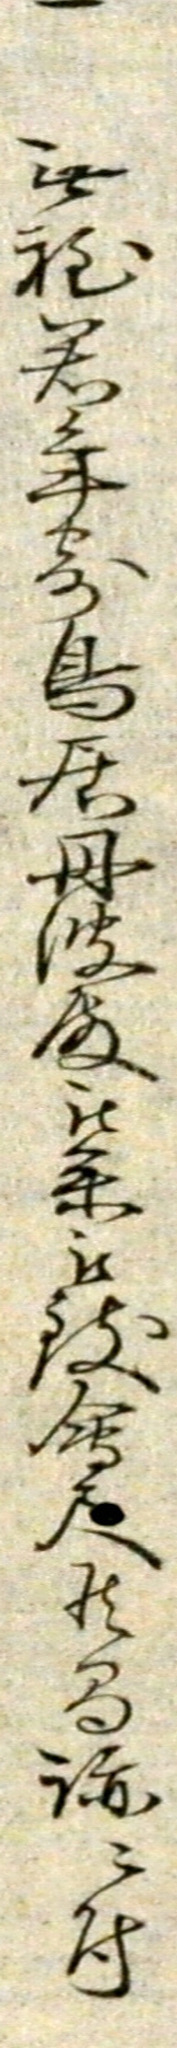一無程若年寄鳥居丹波殿被参被致会尺候間跡ニ付
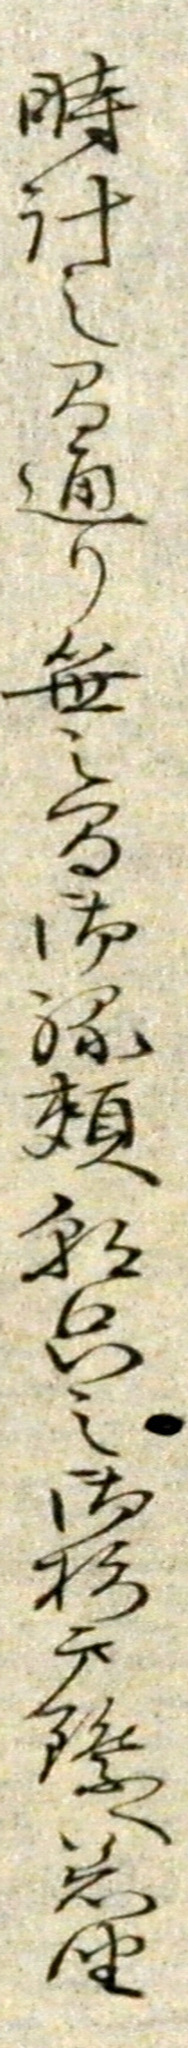時計之間通り笹之間御縁頬朝貌之御杉戸際へ着座
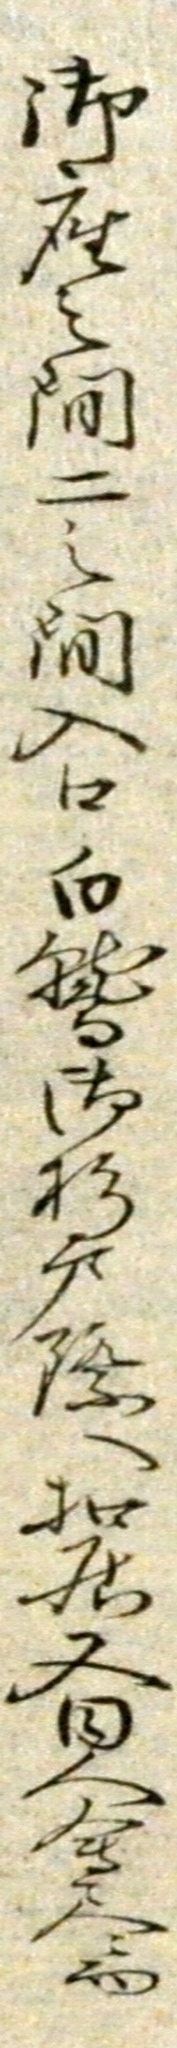御座之間二之間入口白鷲御杉戸際へ扣居又同人会尺ニ而
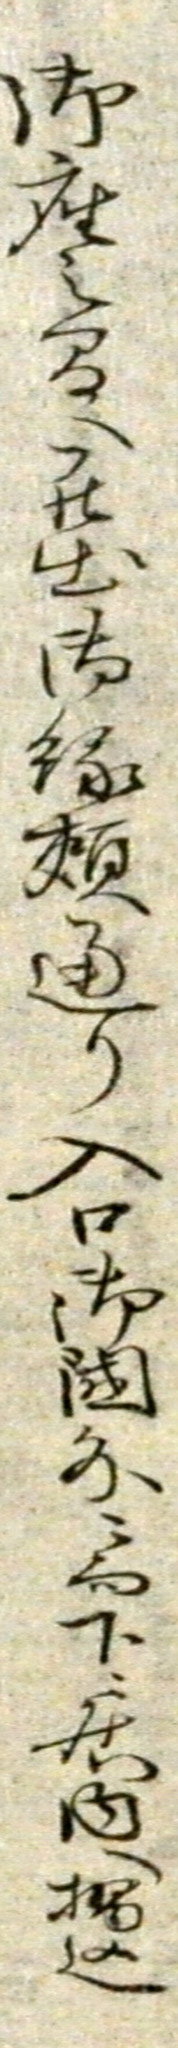御座之間へ罷出御頬通り入口御閾外ニ而下ニ居内ヘ摺込
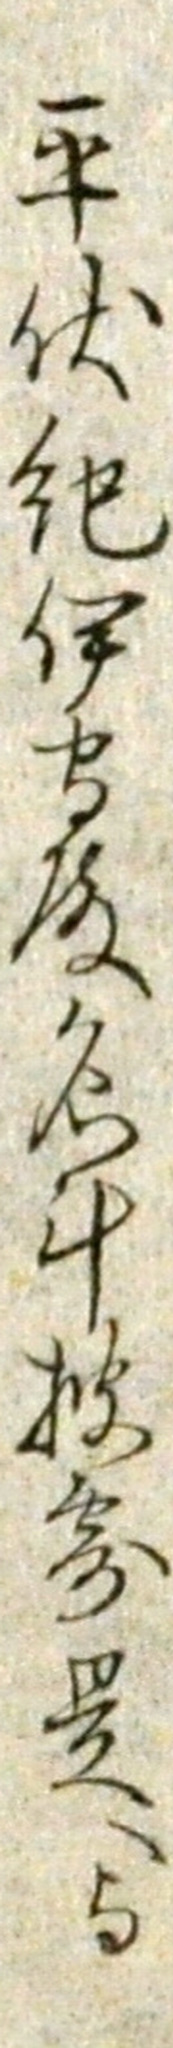平伏紀伊守殿斗披露是ヘ与
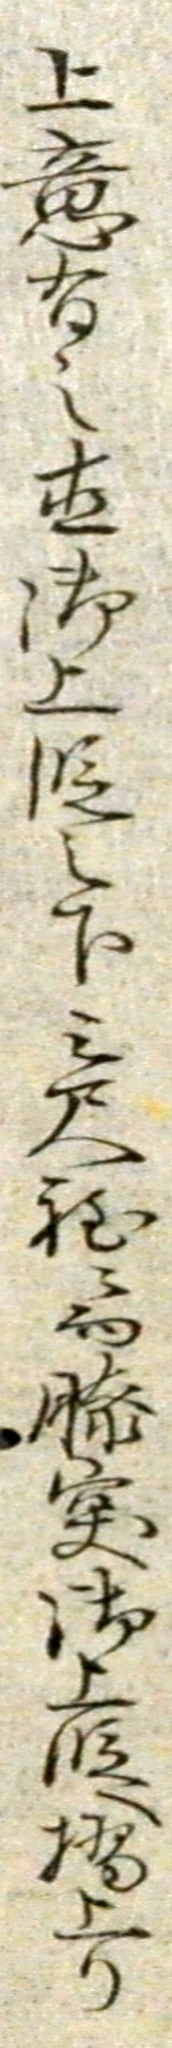上意有之直御上段之下三尺程ニ而膝突御上段ヘ摺上り
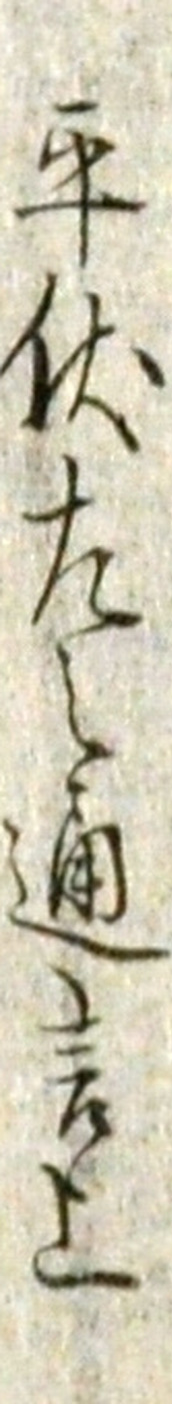平伏左之通言上
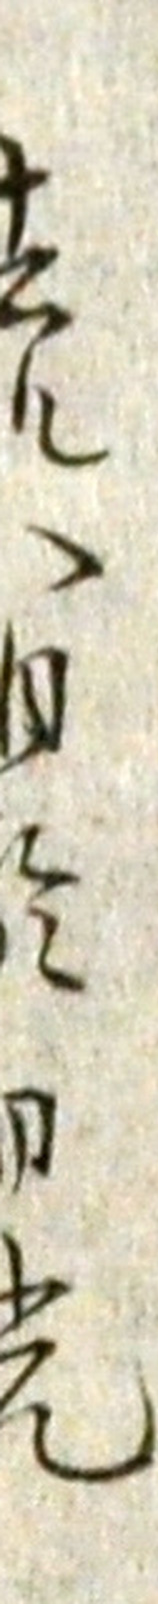去ル八日於日光
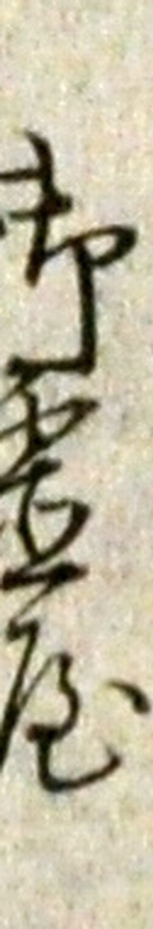御霊屋

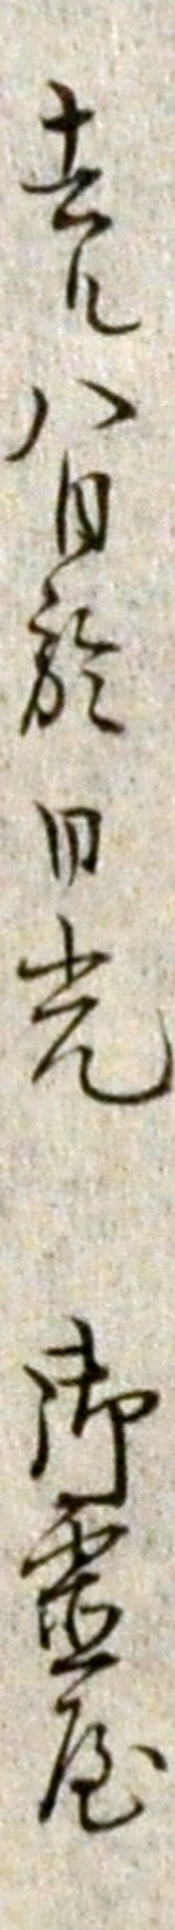去ル八日於日光御霊屋
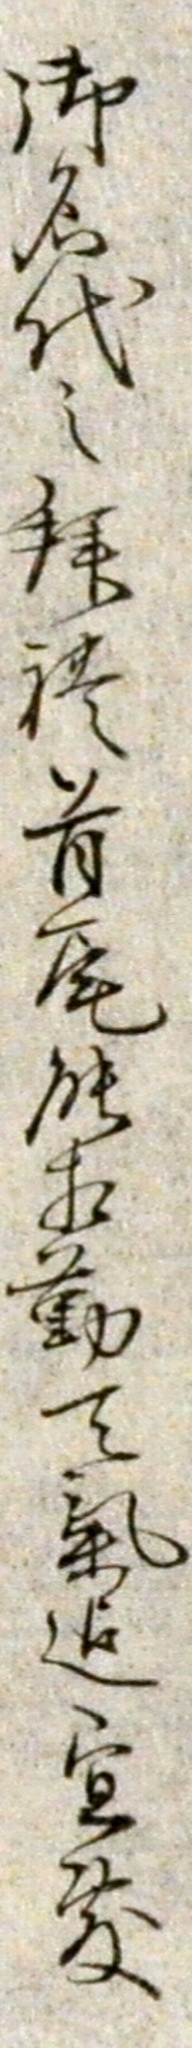御名代之拝礼首尾能相勤天気迄宜敷
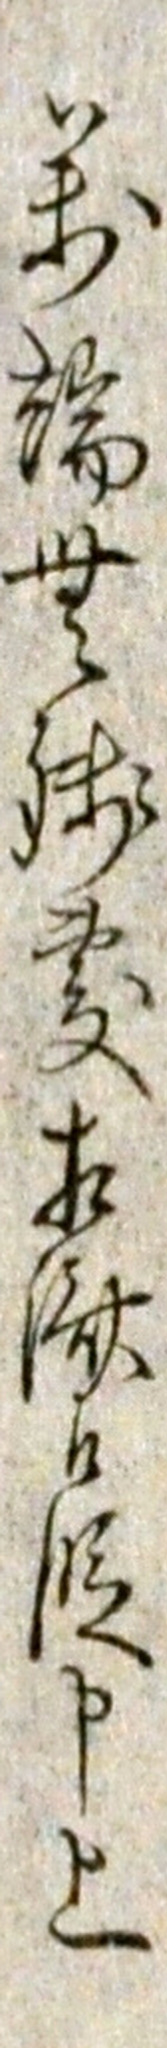万端無残処相済候段申上
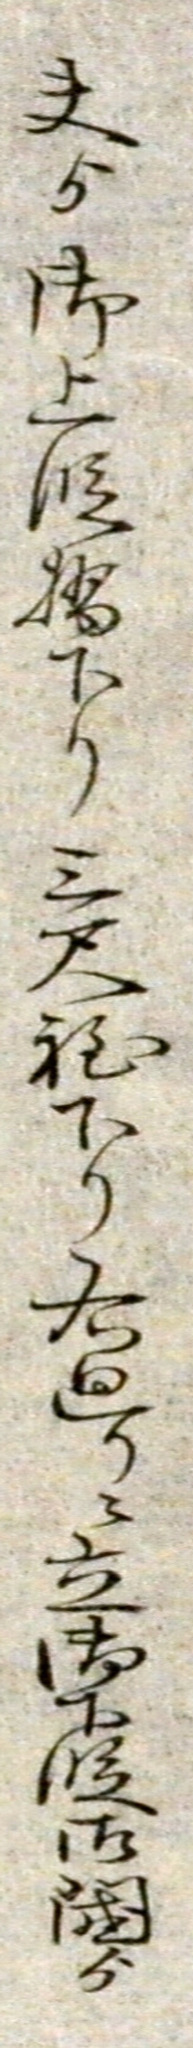夫ゟ御上段摺下り三尺程下り右廻りニ立御下段御閾ゟ
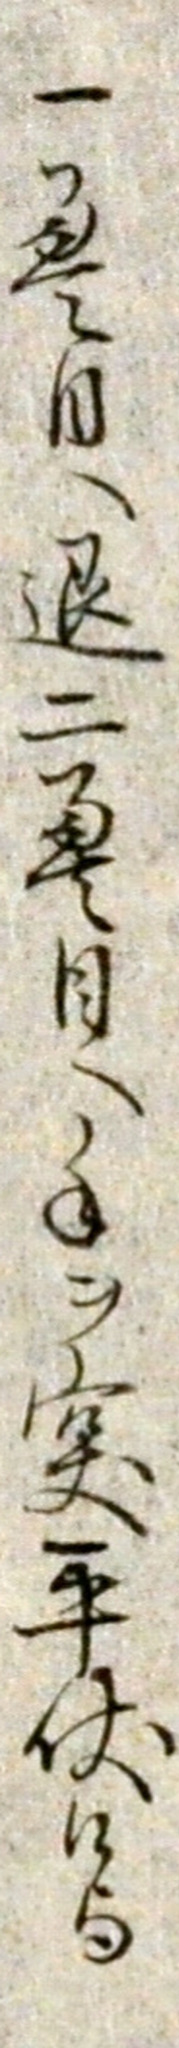一畳目へ退二畳目へ手ヲ突平伏候と
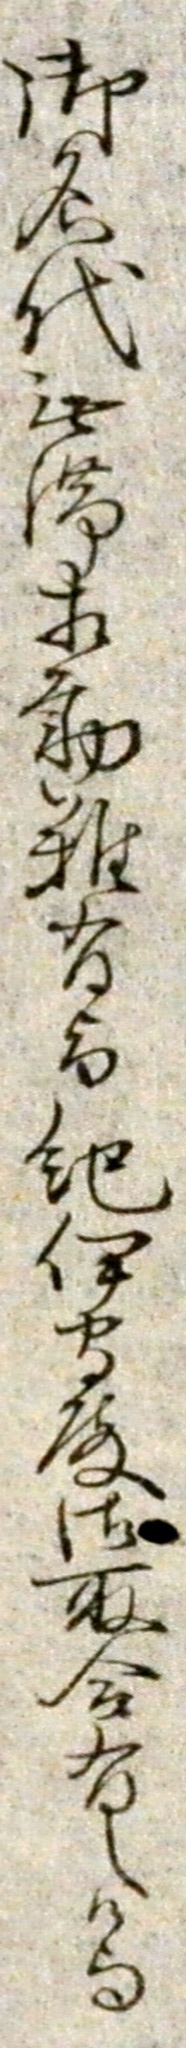御名代無滞相勤難有旨紀伊守殿御取合有之候と
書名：日光御名代相勤候節ノ留
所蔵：伊那市立高遠町図書館・合同会社AMANE
